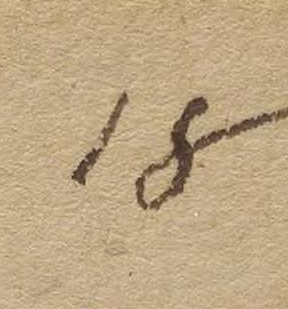18
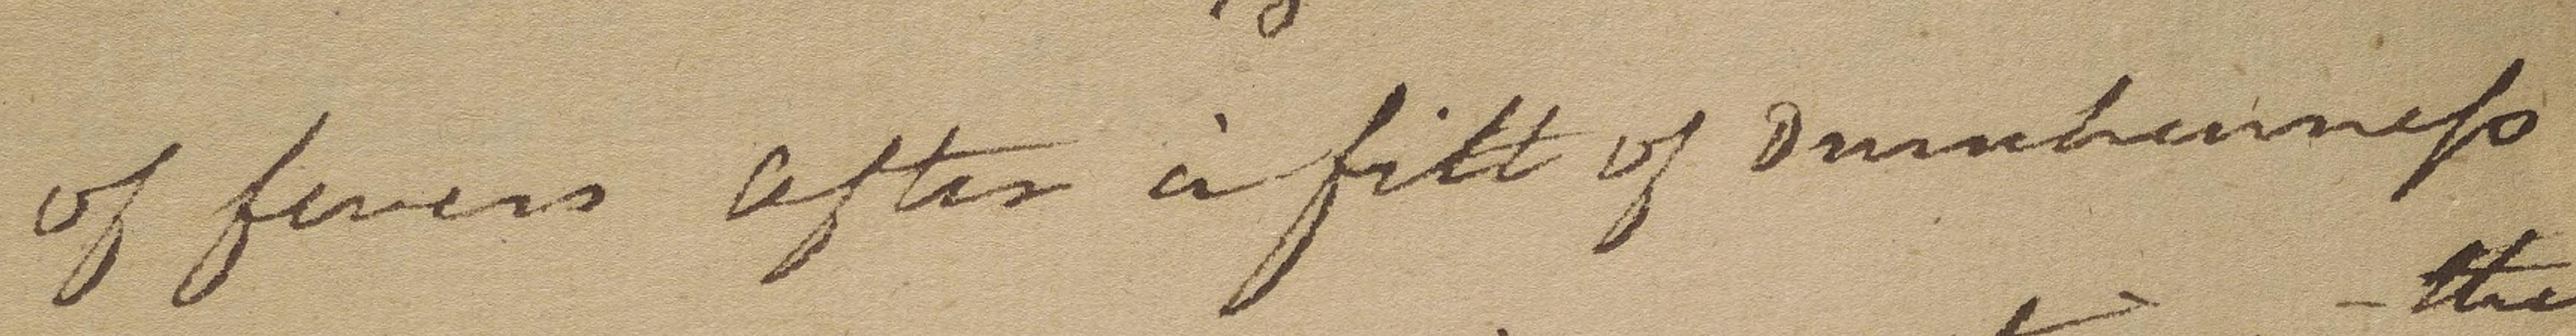of fevers after a fitt of drunkenness
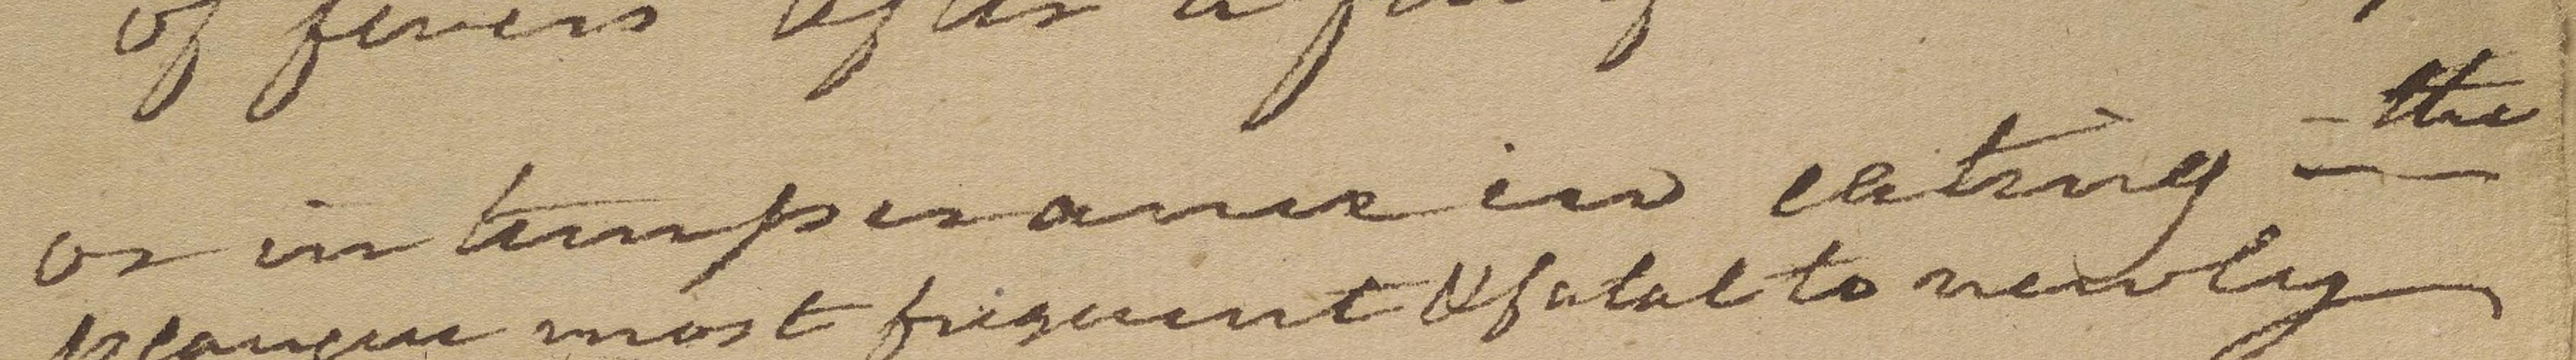or intemperance in eating the
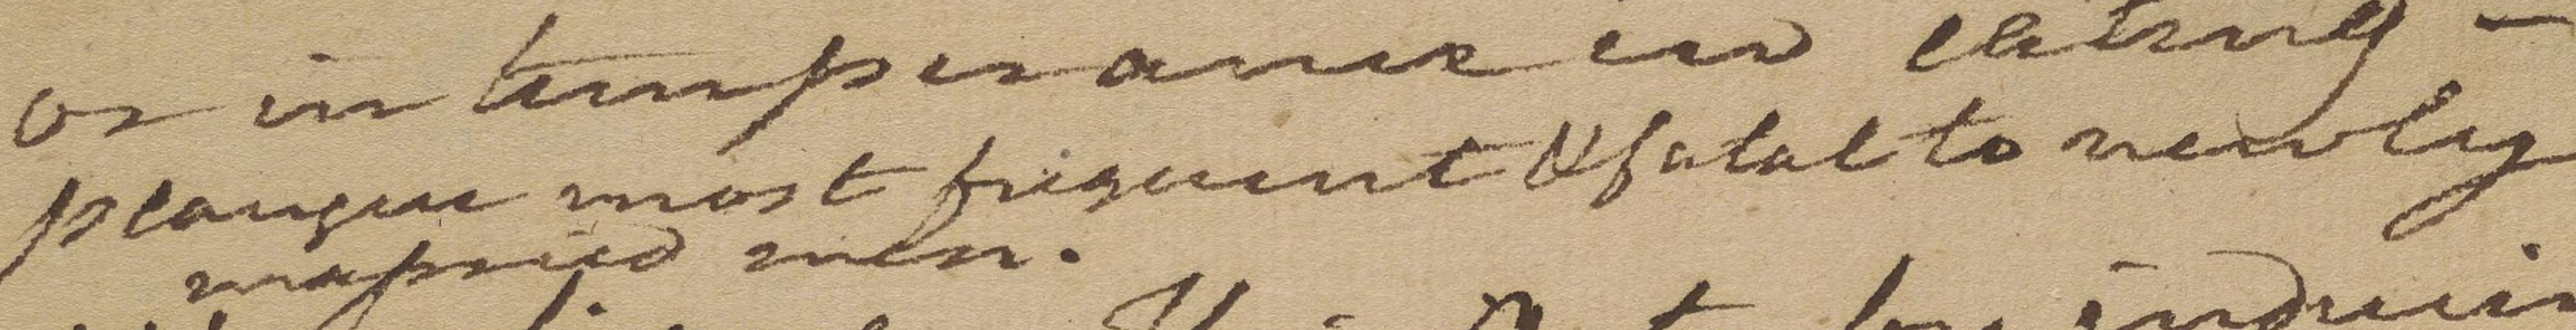plagues most frequent & fatal to nearly
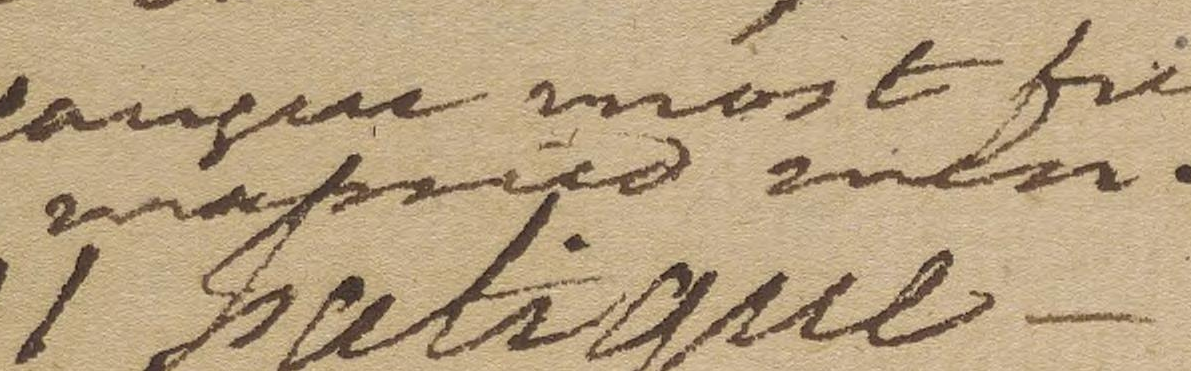married men
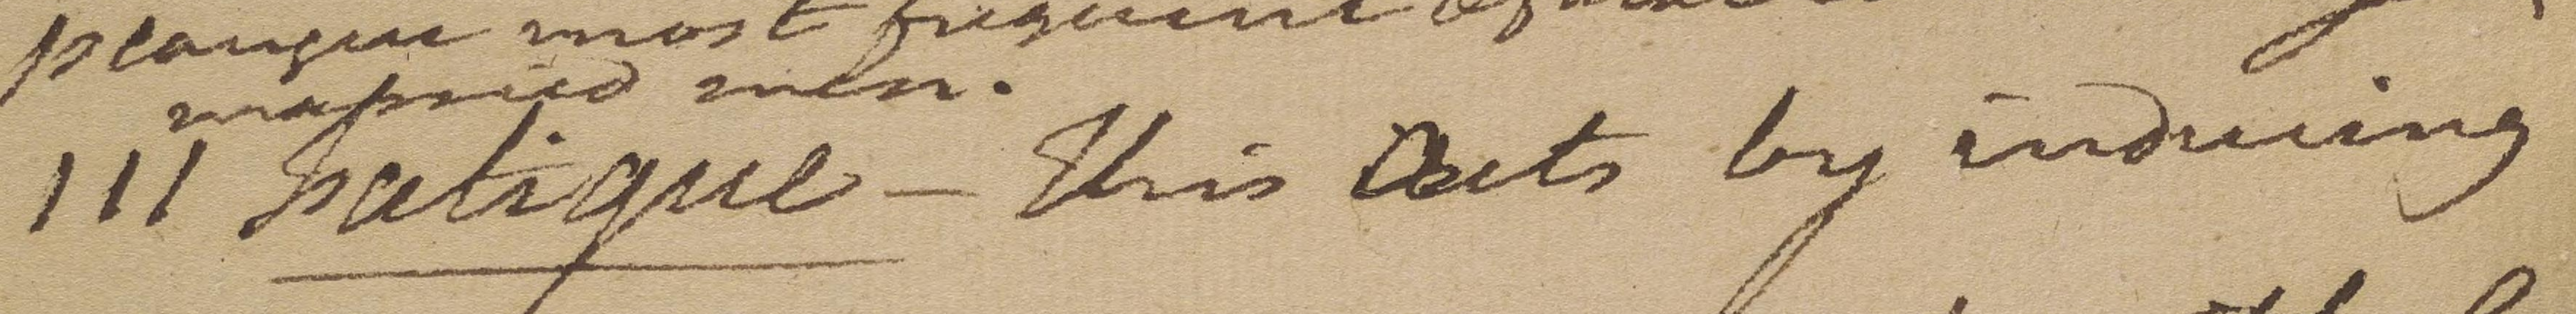III Fatigue - This acts by inducing
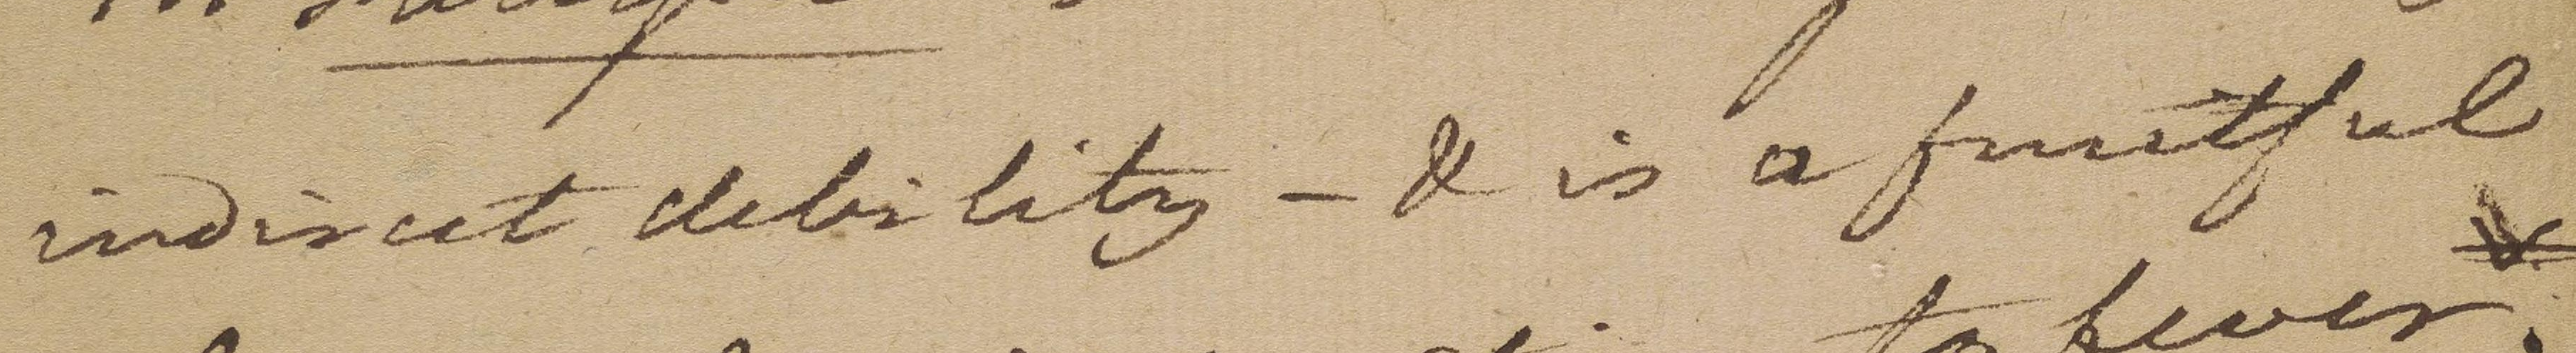indirect debility, & is a fruitful
